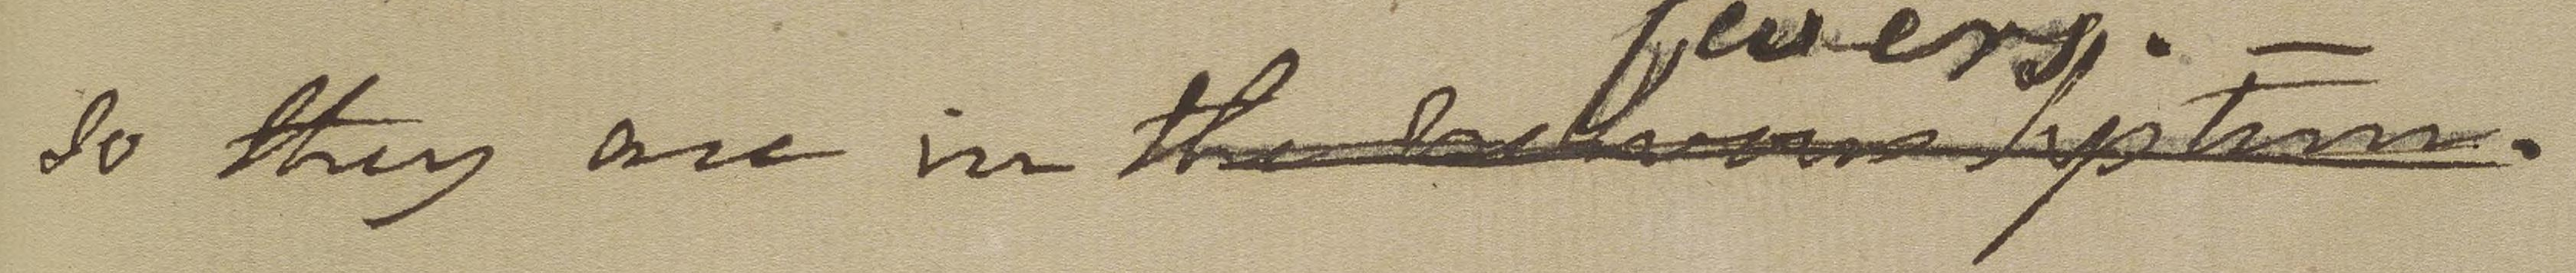So they are in [the nervous system].
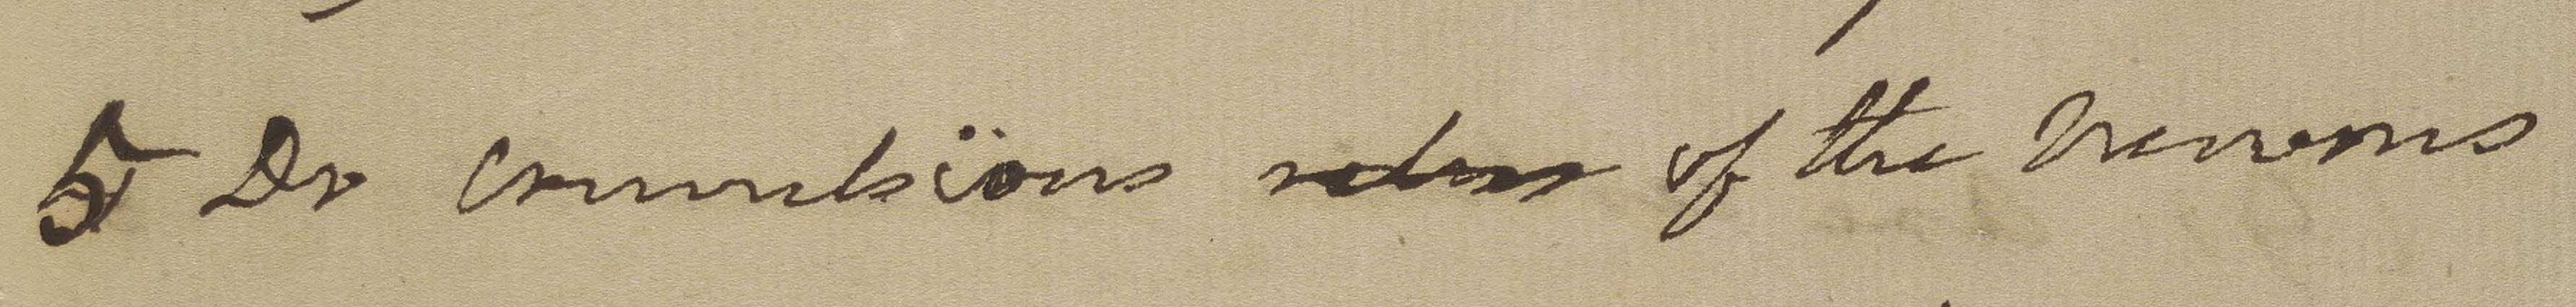5 Do convulsions [retur] of the nervous
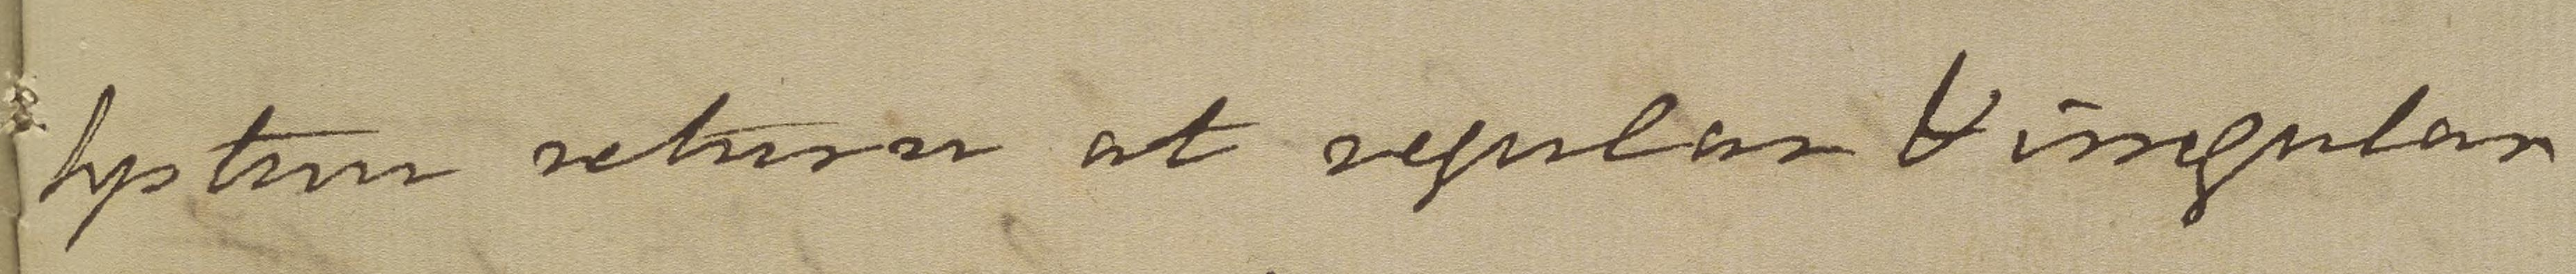system return at regular & irregular
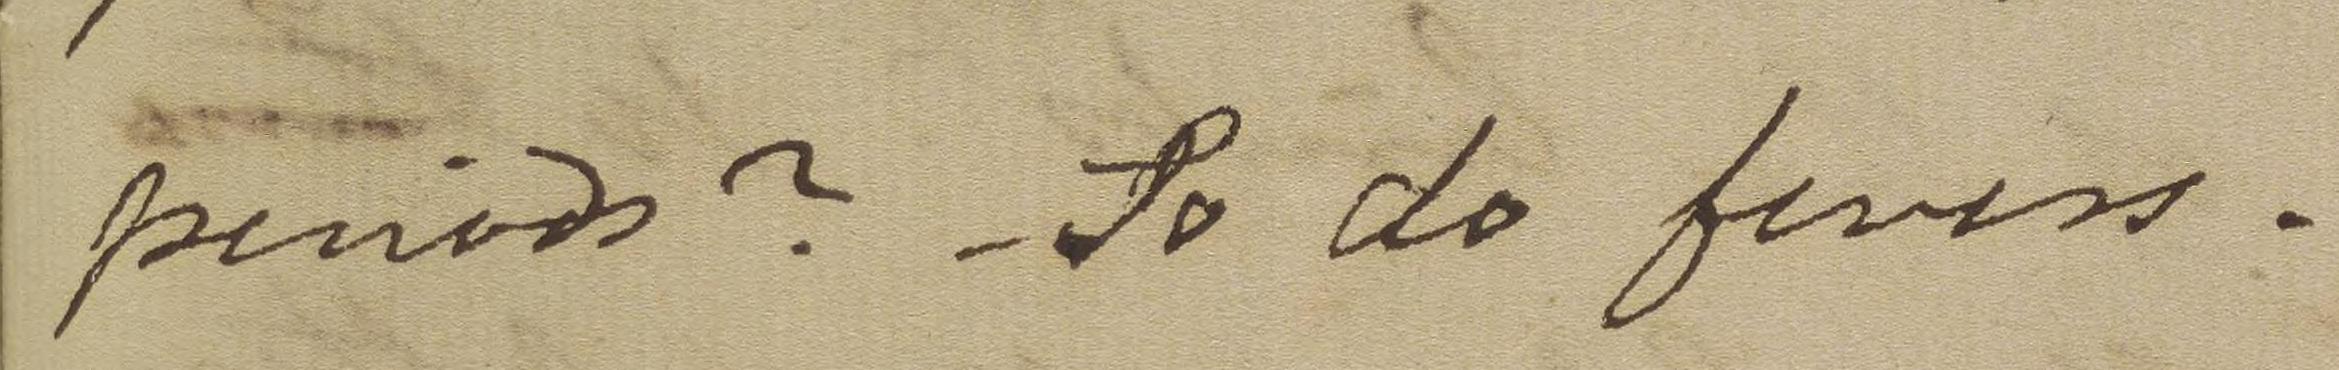periods? So do fevers.
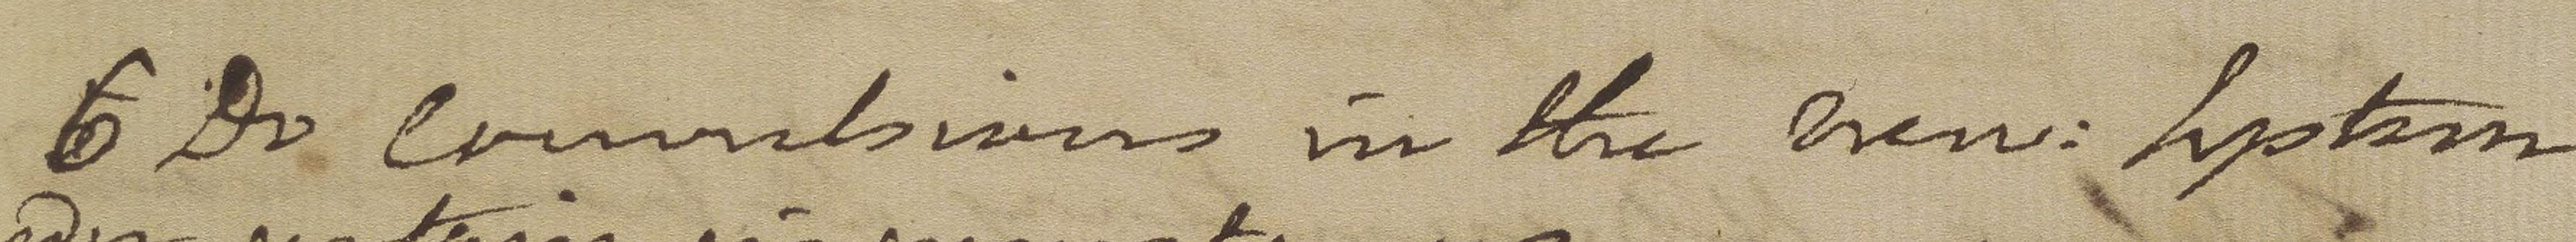6 Do Convulsions in the ner. system
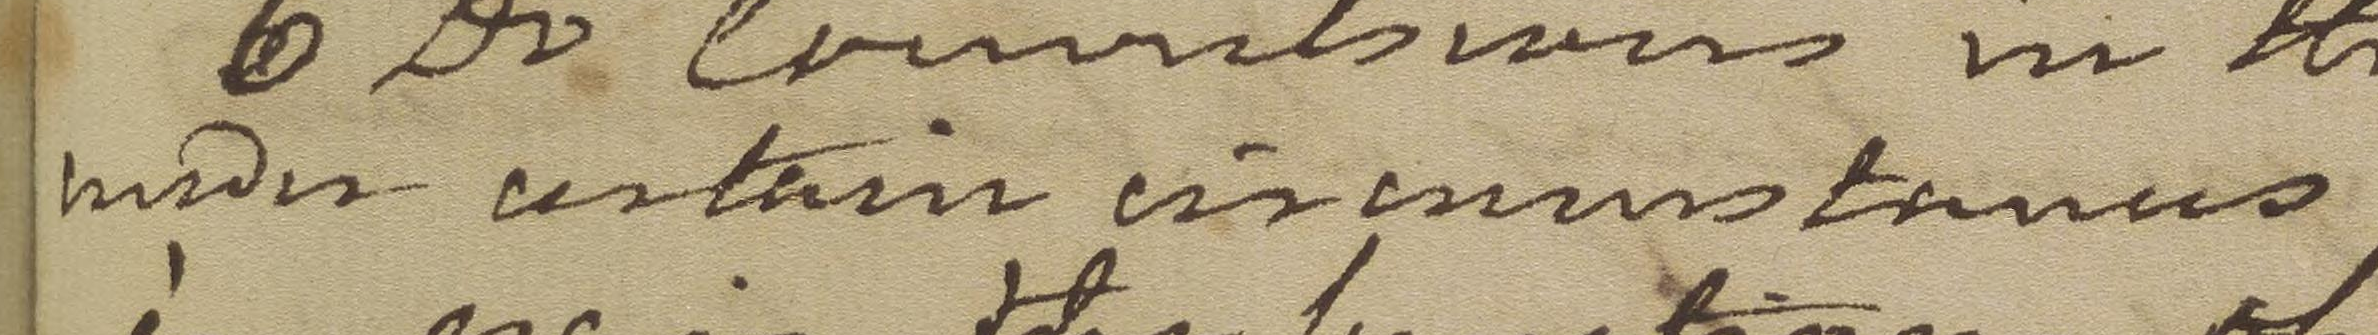under certain circumstances
